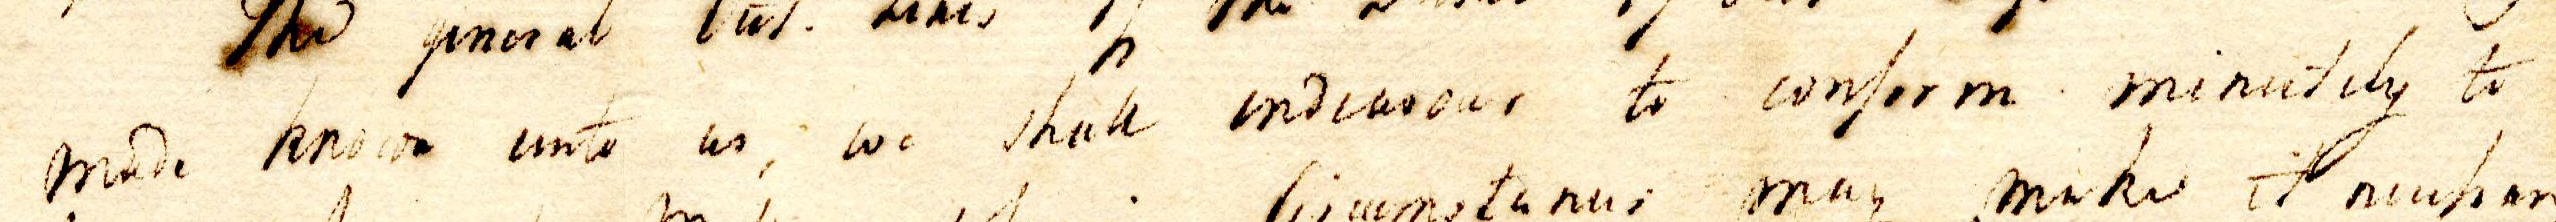made known unto as we shall endeavour to conform minutely to
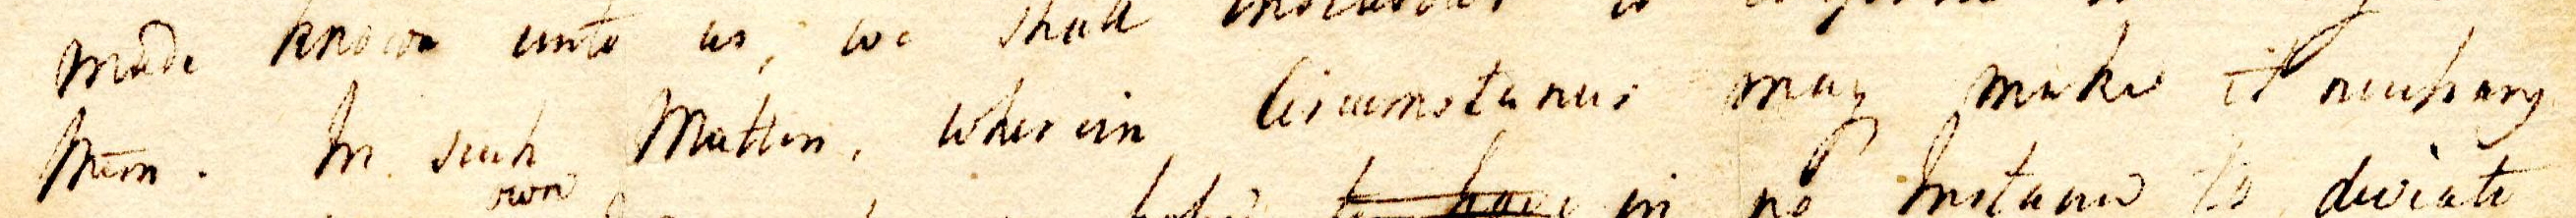them. In such Matter, wherein Circumstances may make it necessary
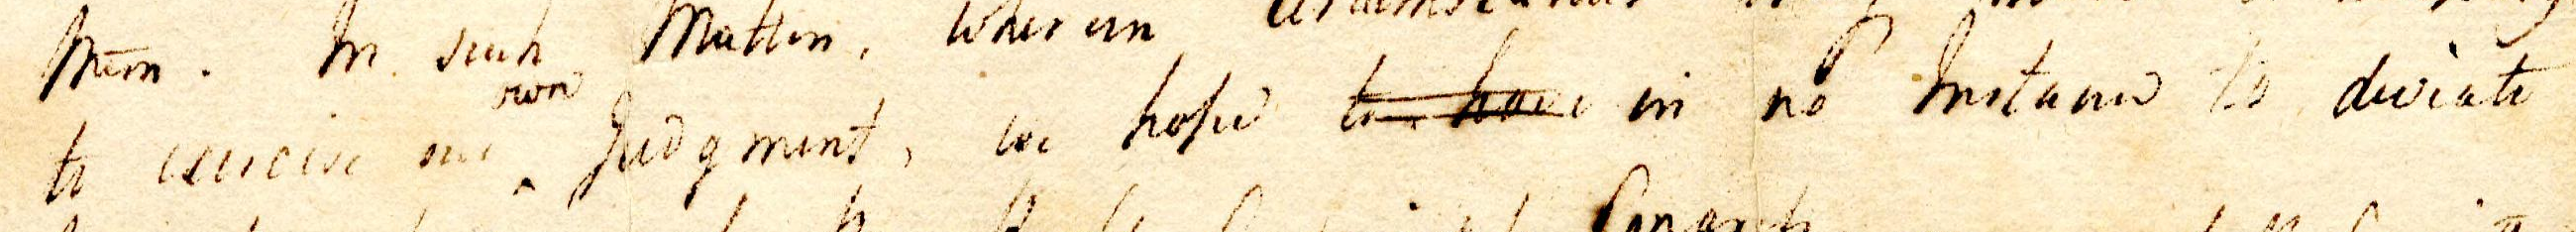to conceive one ^ Judgment, we hope to have in no Instance to deviate
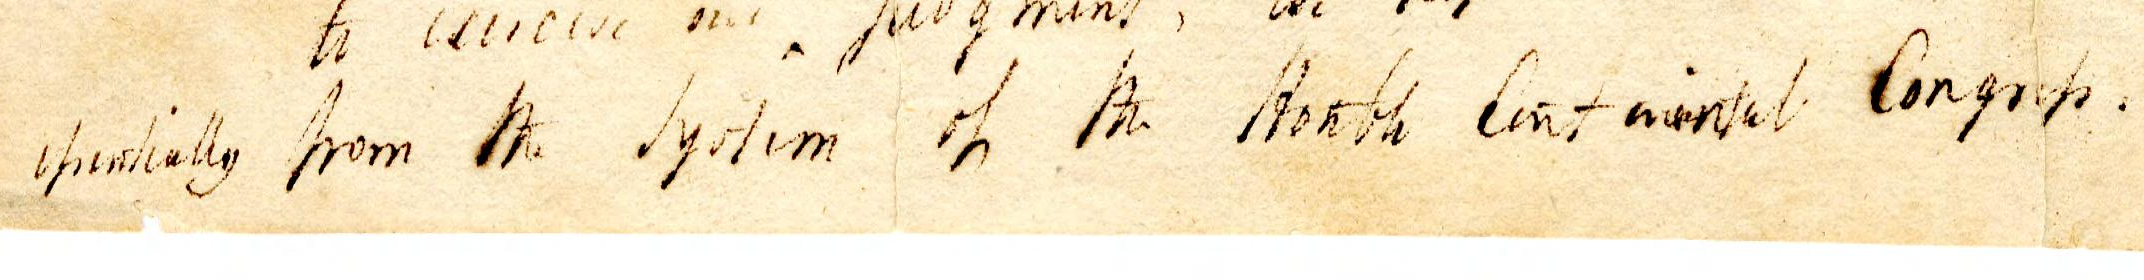opentially from the System of the Honble Continental Congress.
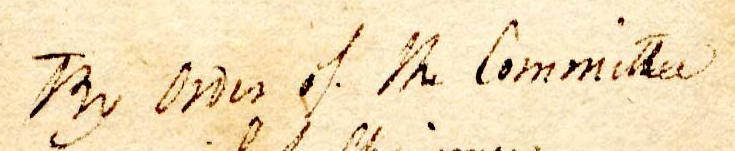By order of the Committee
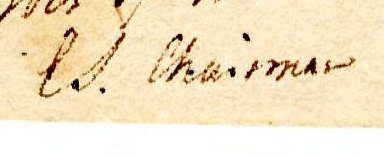CS. Chairman
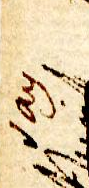say
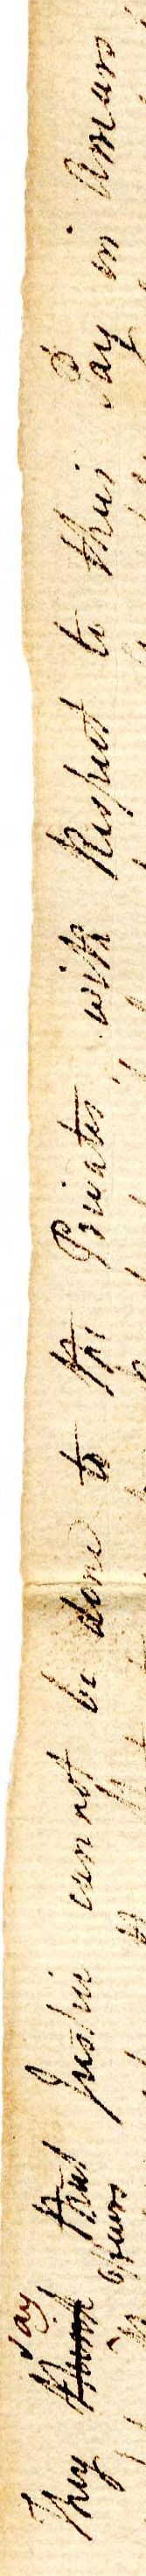They think ^ that Justice cannot be done to the Privates with Respect to their Pay in Arrears
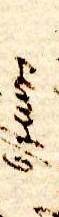Officers
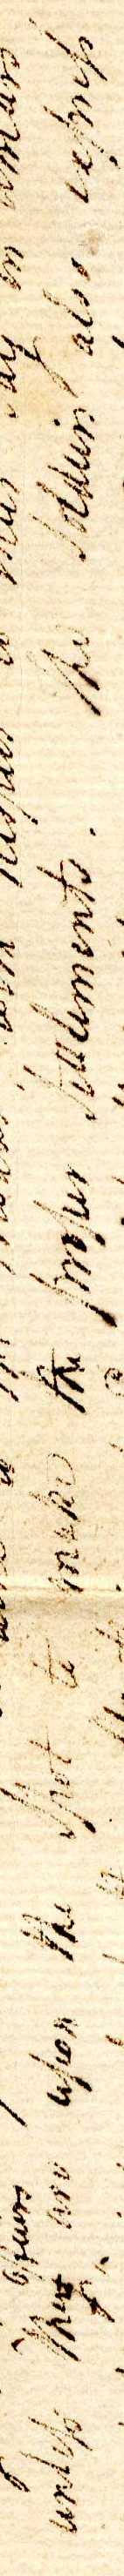unless this ^ are upon the Spot to make the proper Settlements. The Soldiers also express
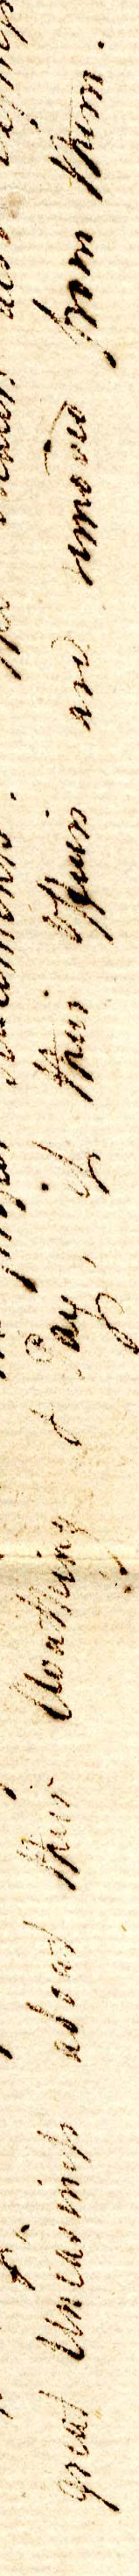great uneasiness about their Cloathing & Pay, if their Officers are removed from them.
